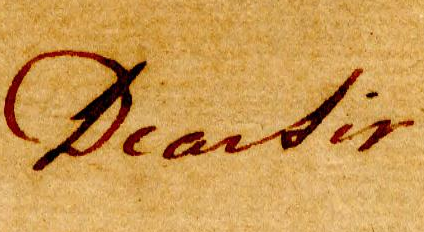Dear Sir
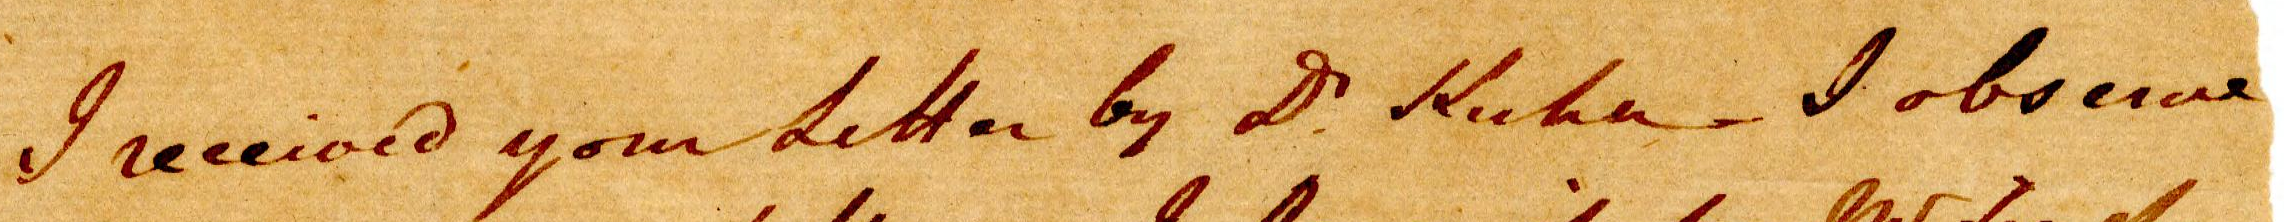I received your Letter by Dr. Kuhn. I observe
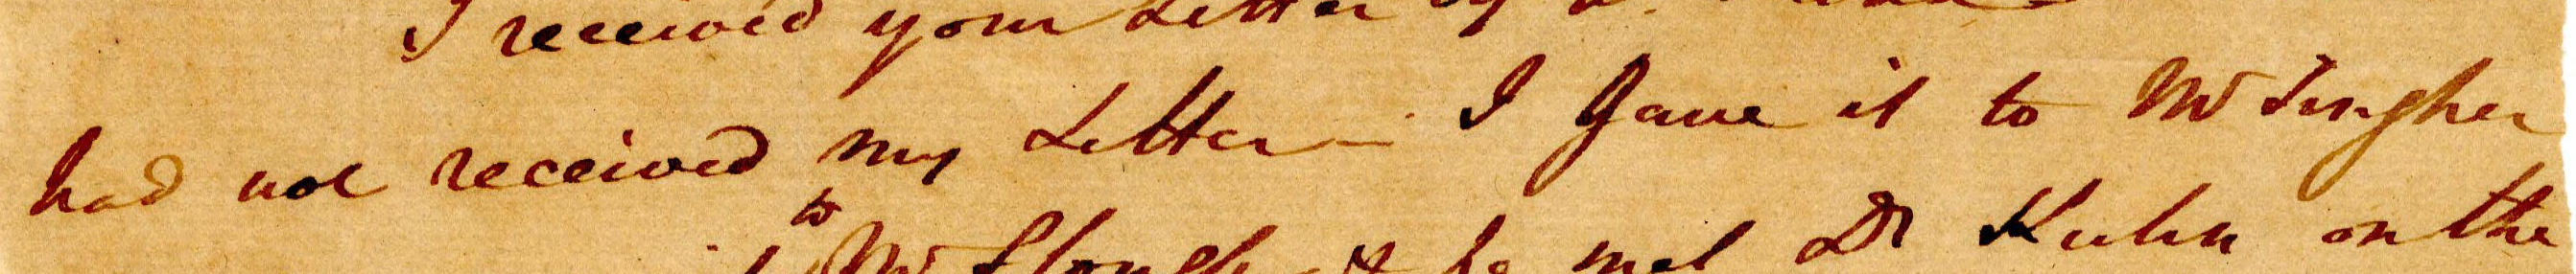had not received my Letter. I gave it to M^r Singher
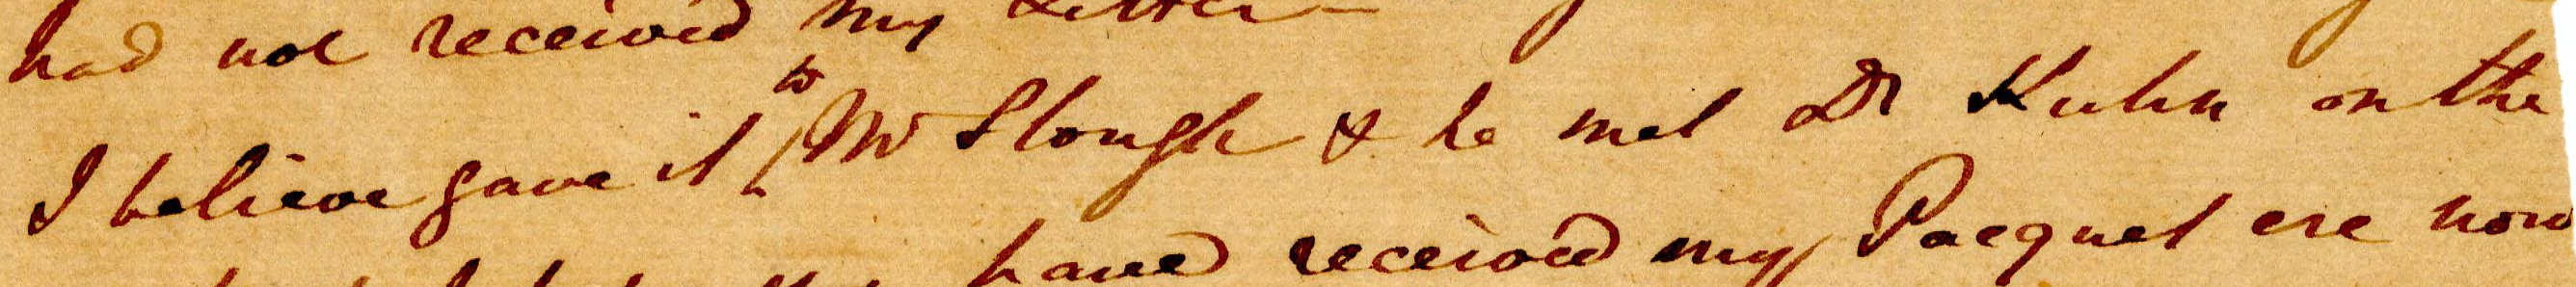I believe gave it ^ M^r Slough & he met D^r Kuhn on the
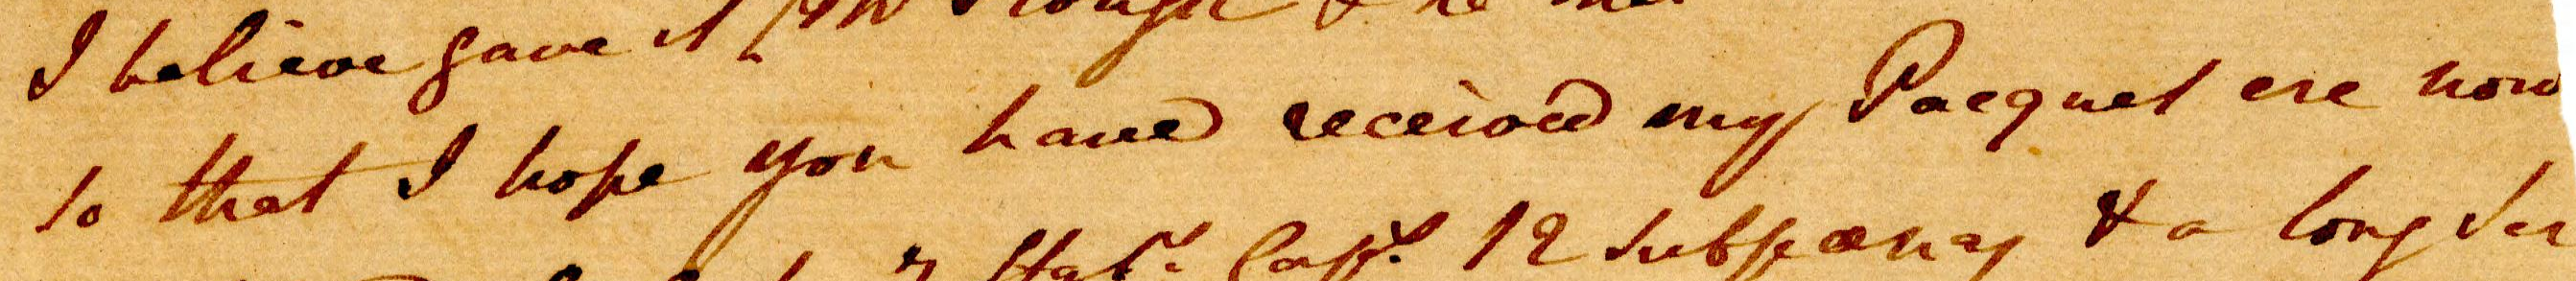so that I hope you have received my Pacquet are now
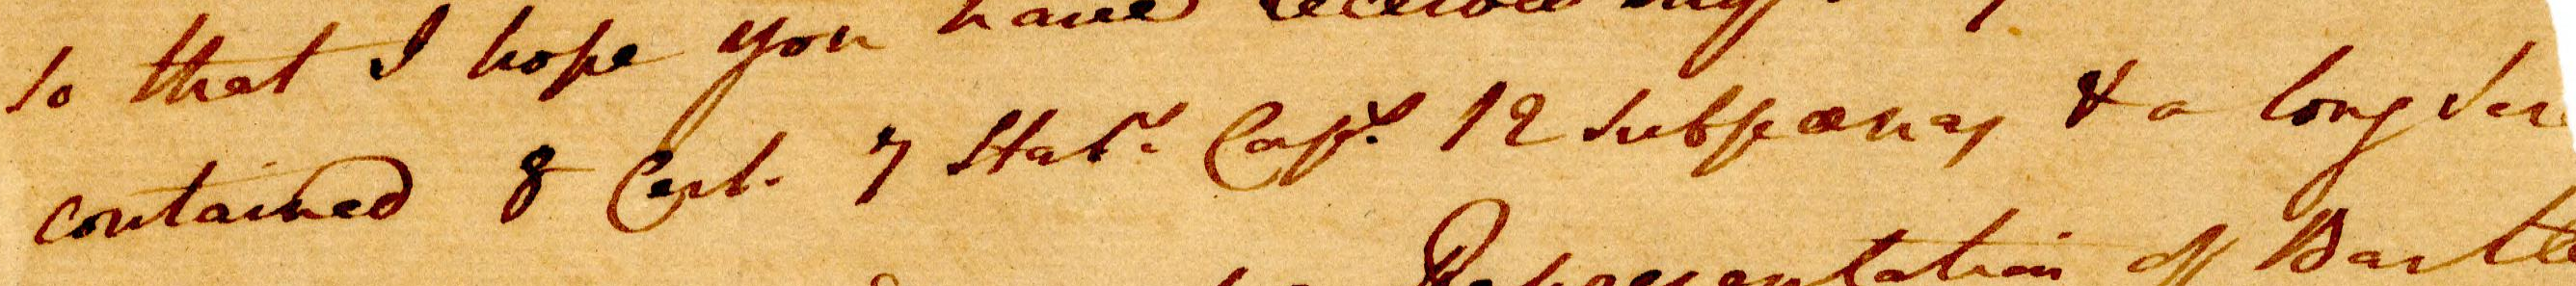contained & Capt. 7 Har^s. Cap^t. 12 subpoenas & a long Ser
